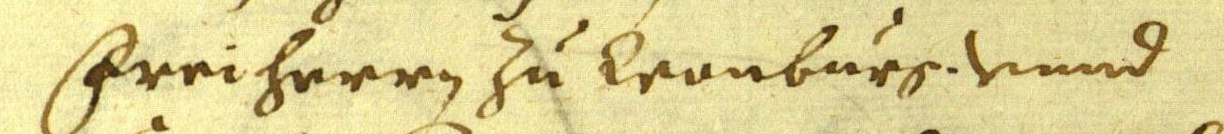Freiherrn Zū Leonbūrg. vnnd
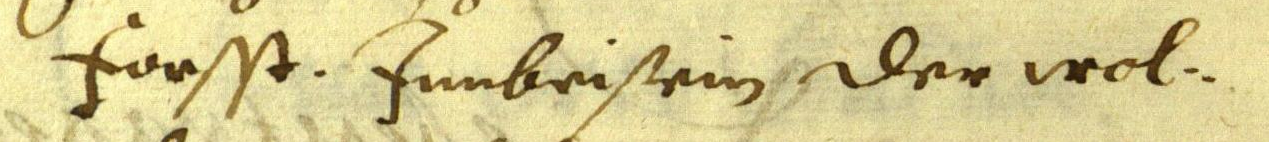Forsst. Innbeisein der wol¬
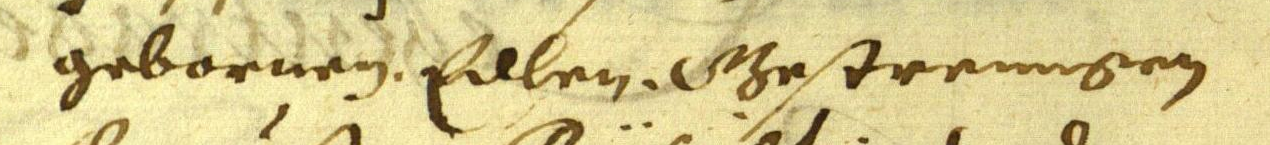gebornen. Edlen. Gestrenngen,
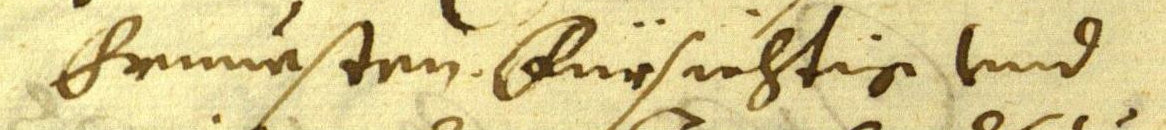Ernnvēsten. Fürsichtig vnd
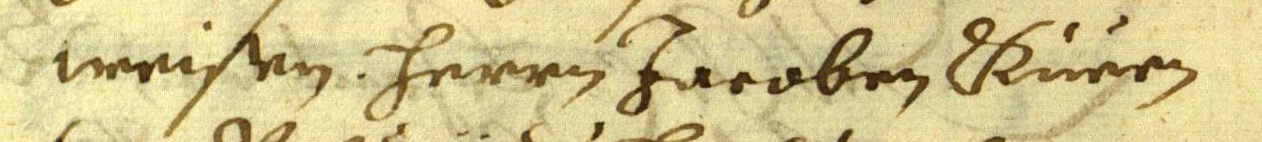weisen. Herrn Jacoben Kūēen
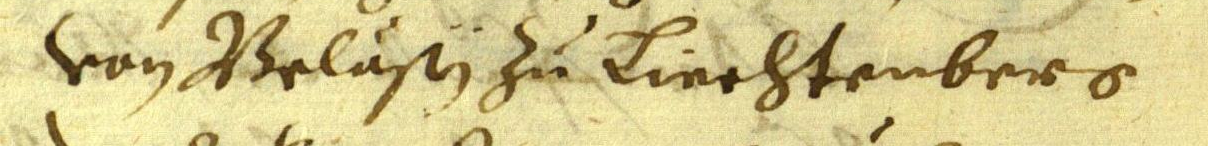von Belāsÿ Zū Liechtenberg
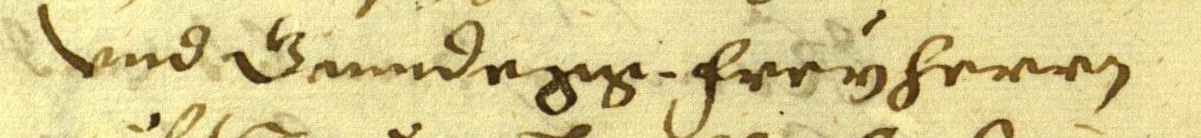vnd Gandegg. Freȳherrn
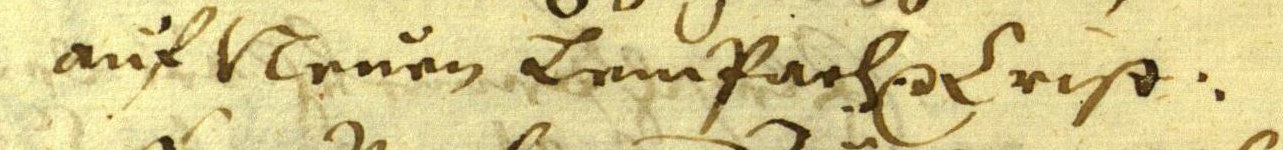aūf Neūen LemPach etc. Crist¬
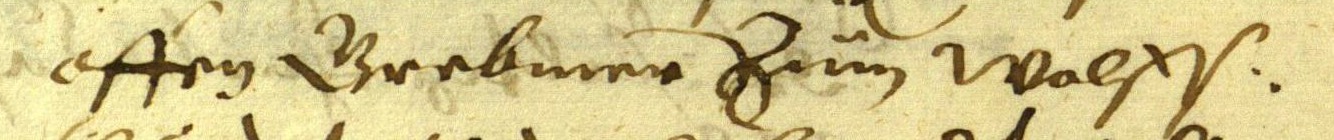offen Grebmer Zūm Wolfs¬
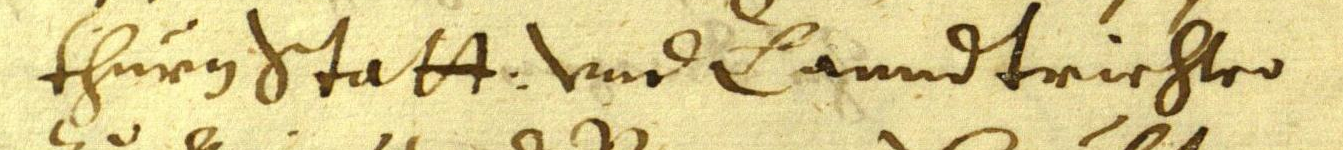thūrn Statt: vnd Landtrichter
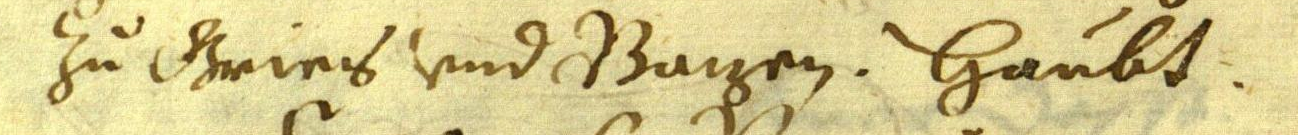zū Gries vnd Bozen, Haūbt¬
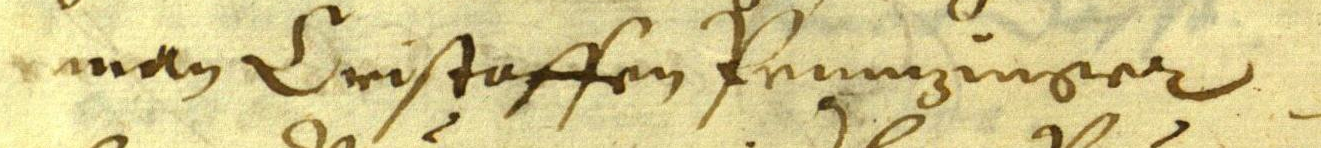man Cristoffen Pennzinger,
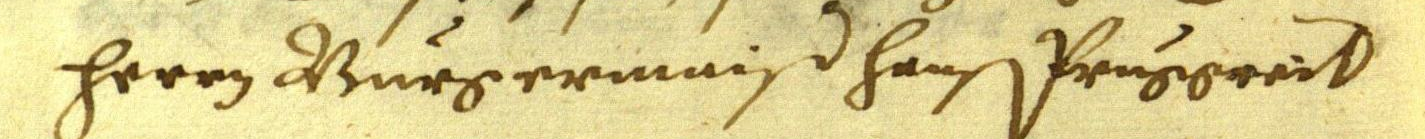Herrn Būrgermaist Hans Prūggreit
